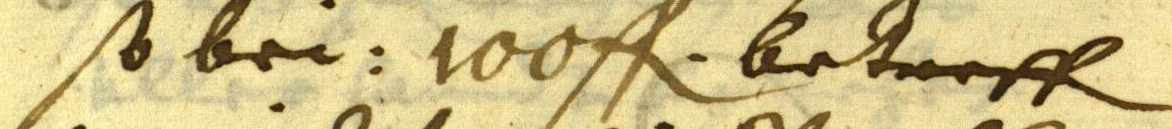so bei: 100 fl. betreff
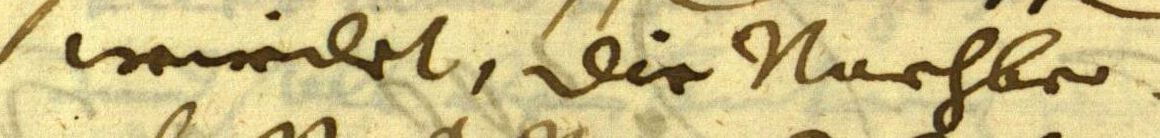wirdet, die Nachber¬
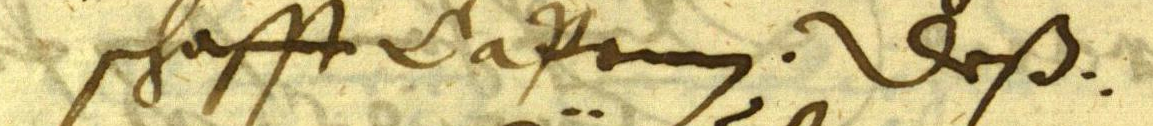schafft Capenn. Deß¬
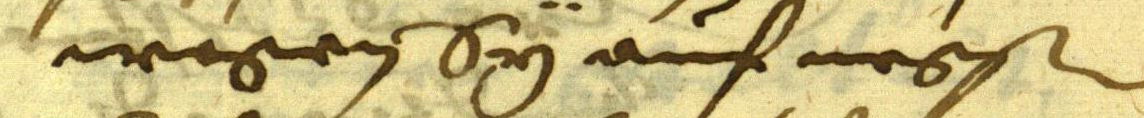wegen Sÿ aūf negst
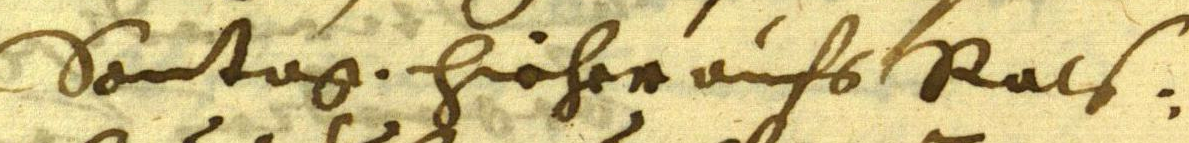Sontag. hieher aūfs Rats¬
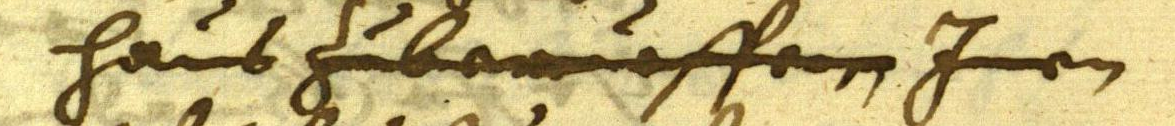haūs Zūberūeffen Inen
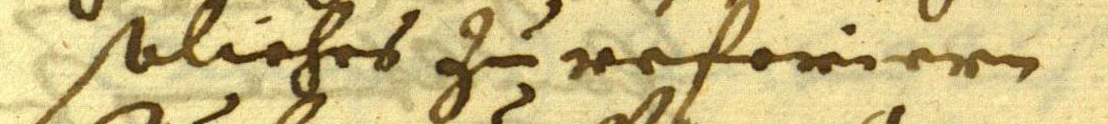soliches Zū referiern
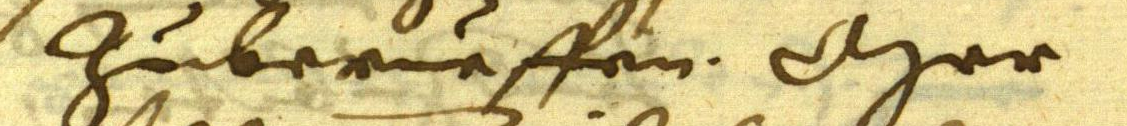Zūberūeffen. Mer
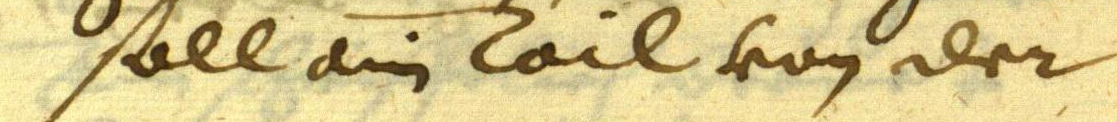soll ain Tail von der
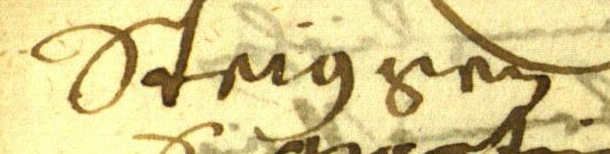Steig gen
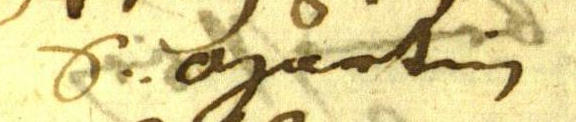S: Martin
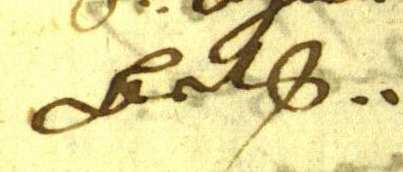bet:
